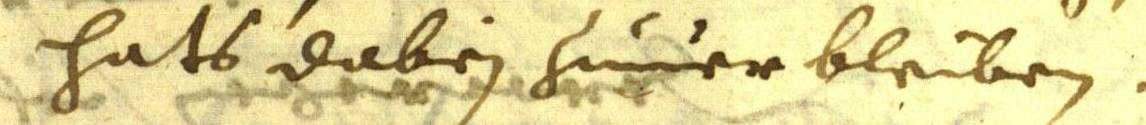hats dabej Zūūerbleiben.
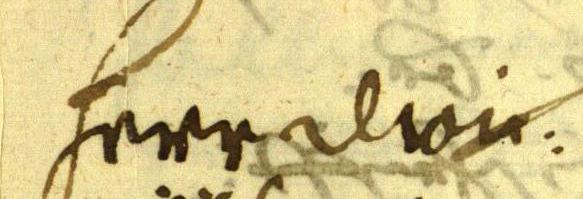Herr Dion¬
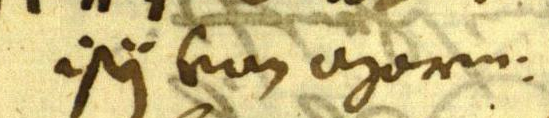isÿ von Morn¬
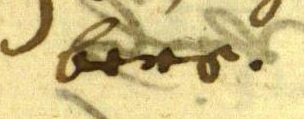berg.
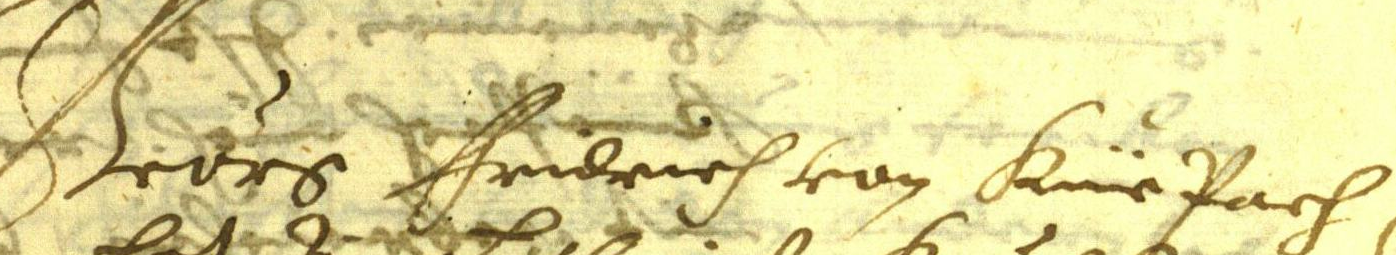Geōrg Fridrich von Küe Pach etc
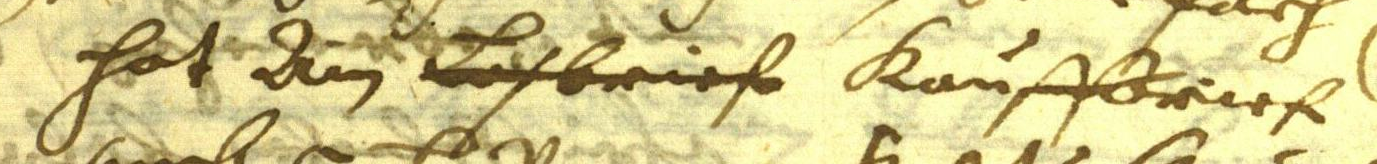hat Ain Losbrief Kaūffbrief
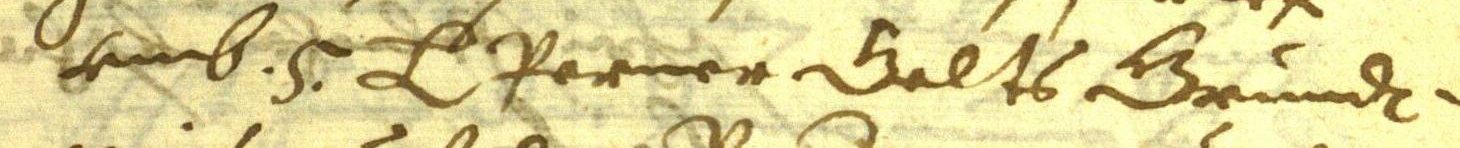vmb .5. L Perner Gelts Grūndt¬
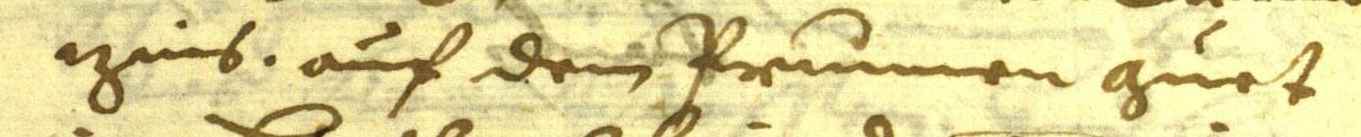zins. aūf dem Prūnnen gūet
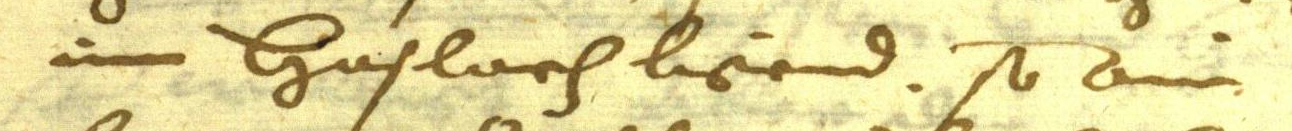inn Haslach ligend. so Aim
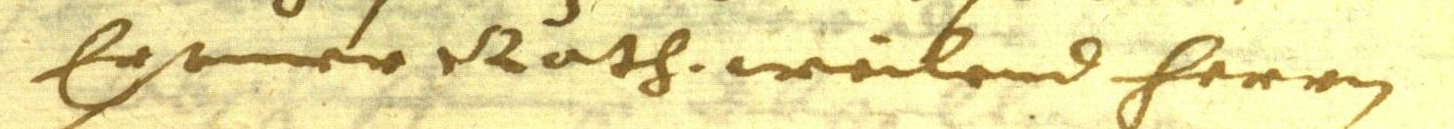Ersamen Rath. weilend herrn
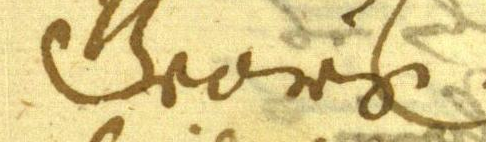Geōrg
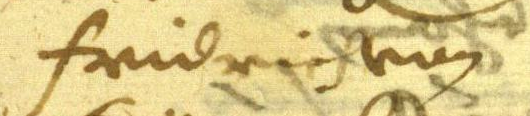Fridrich von
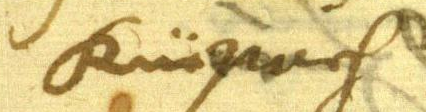Küepach.
